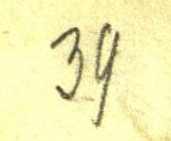39
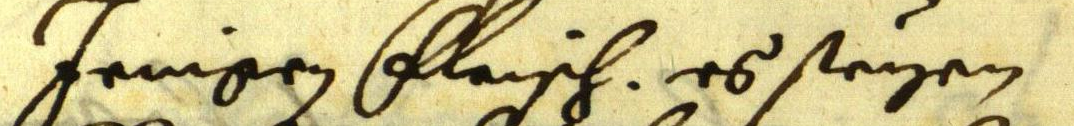Jenigen Fleisch. es seȳen
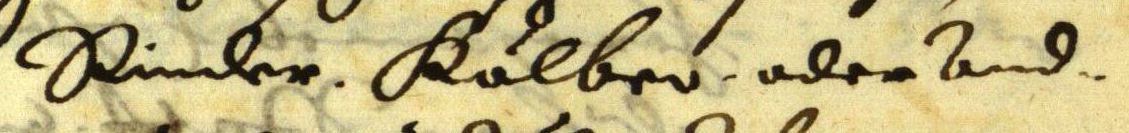Rinder. Kälber. oder And¬
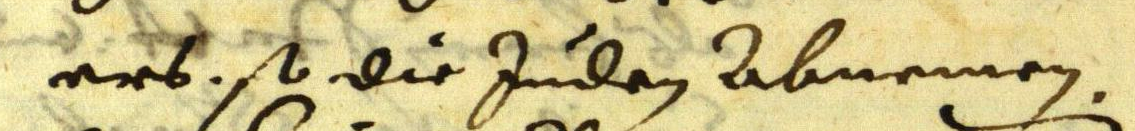ers. so die Jūden Abnemen.
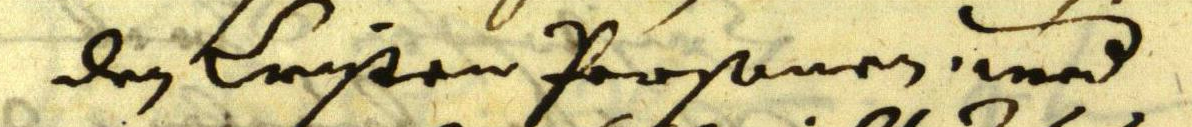den Cristen Personen. wed
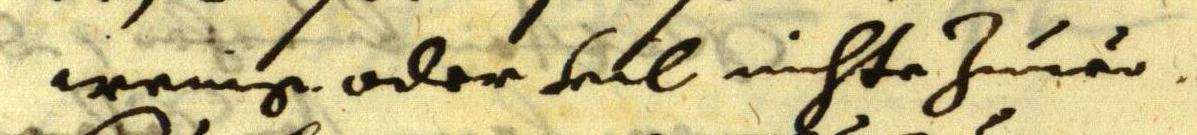wenig oder vil nichte Zūūer¬
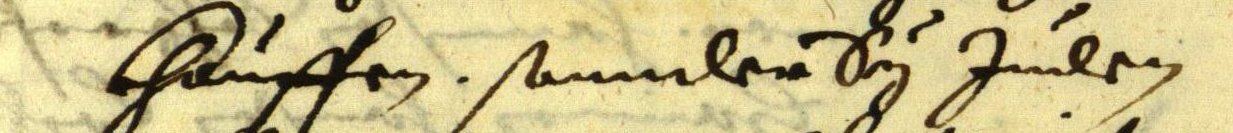khaūffen. sonnder Sȳ Jūden
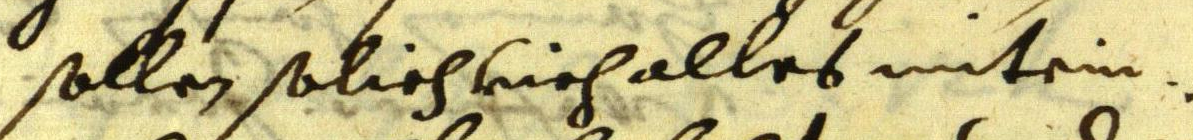sollen solich Vieh alles mitein¬
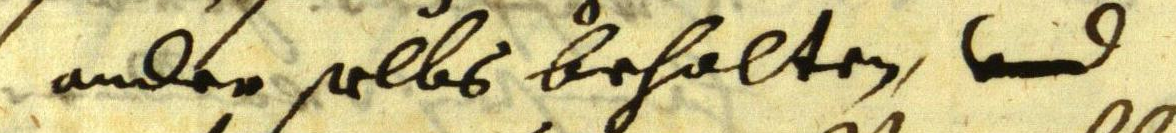ander selbs behalten, vnd
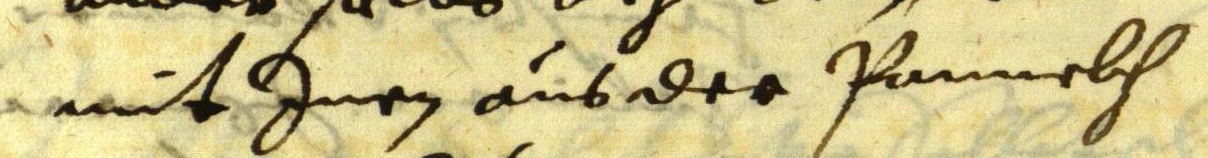mit Inen aūs der Pannckh
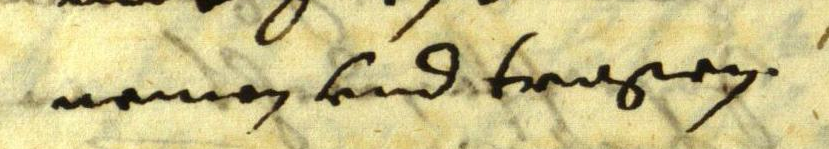nehmen vnd tragen.
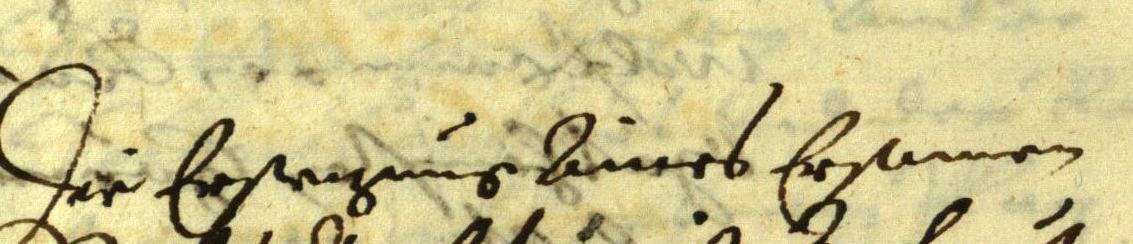Die Ersezūng Aines Ersamen
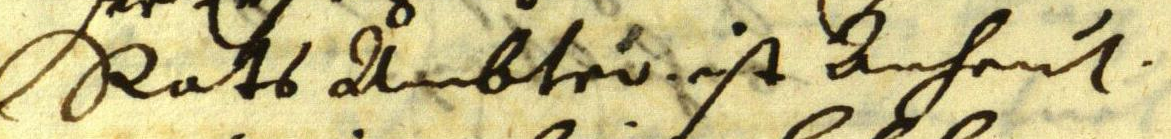Rats Ambter. ist Anheūt.
